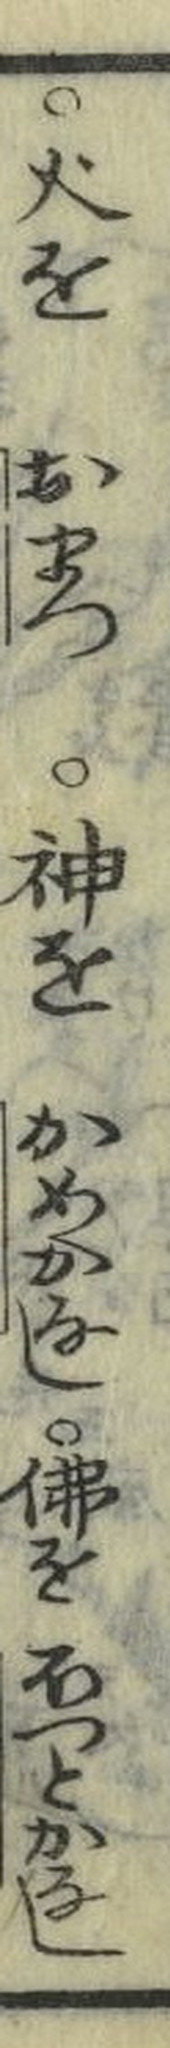○火をおまつ○神をかめかなし○仏をほつとかなし
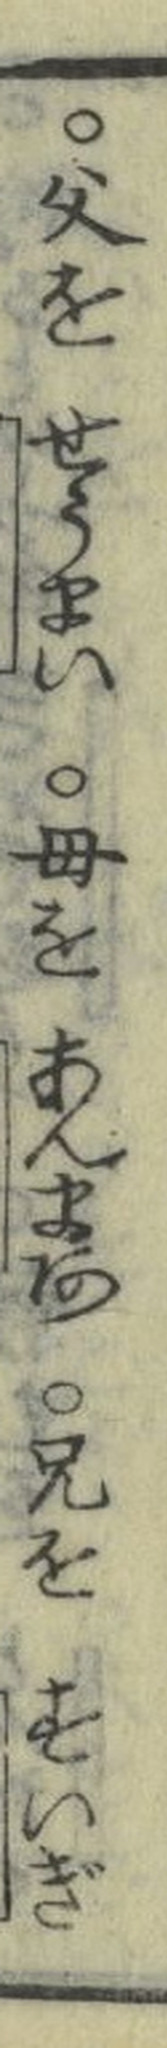○父をせうまい○母をあんまあ○兄をすいぎ
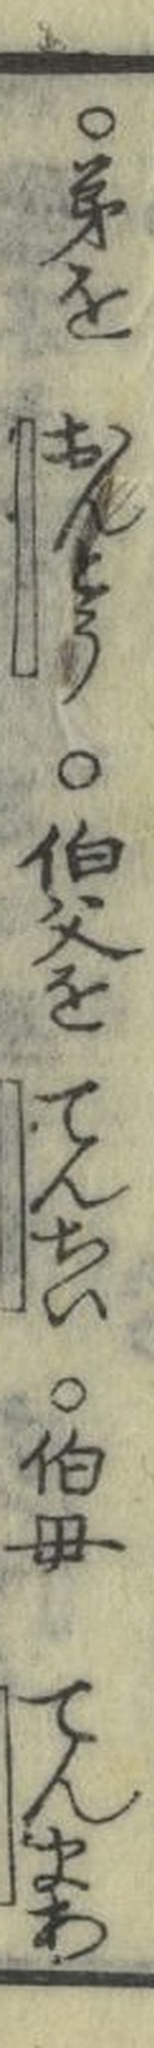○弟をおんとう○伯父をてんちい○伯母をてんまあ
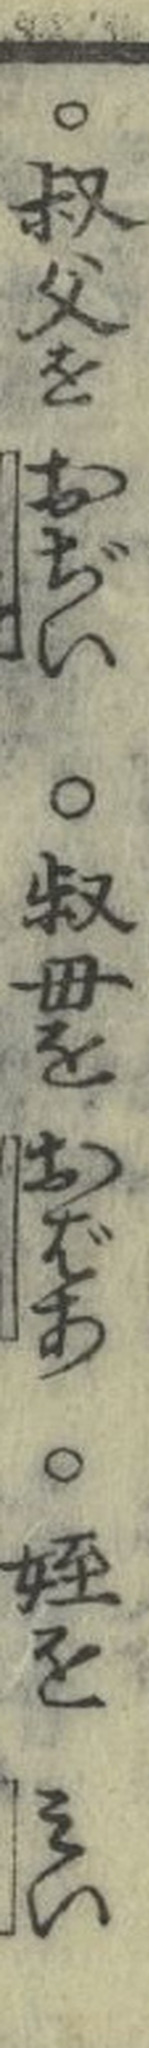○叔父をおぢい○叔母をおばあ○姪をみい
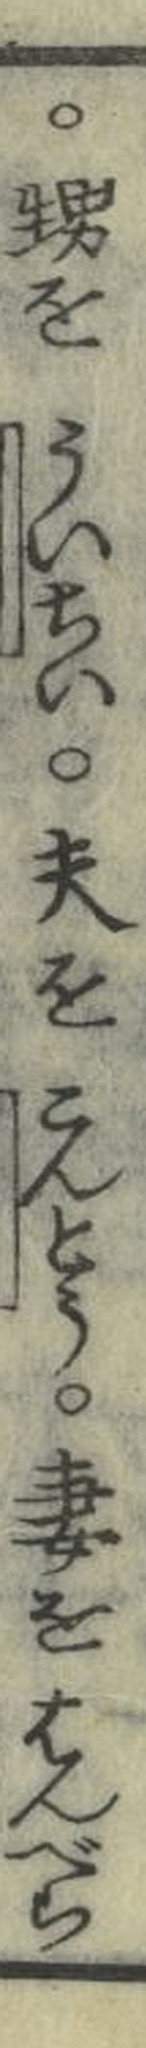○甥をういちい○夫をこんとう○妻をはんべち
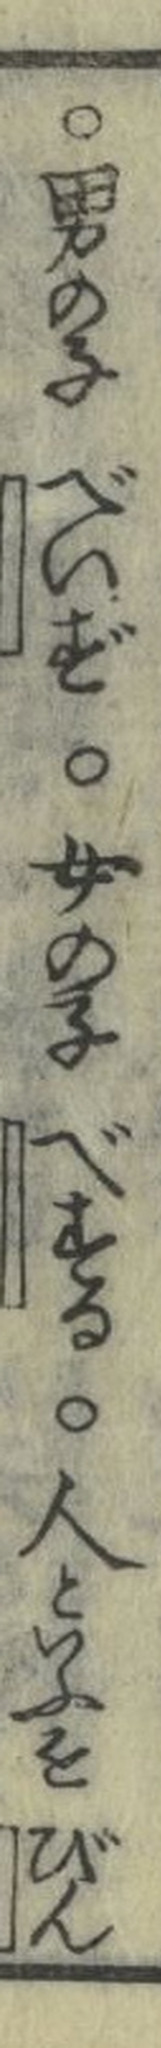○男の子べいず○女の子べする○人といふをびん
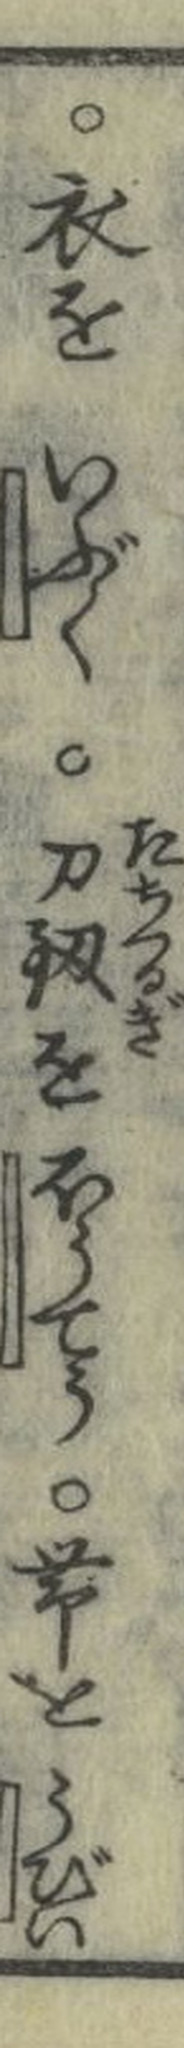○衣をいぶく○刀剣をほうてう○帯をうびい
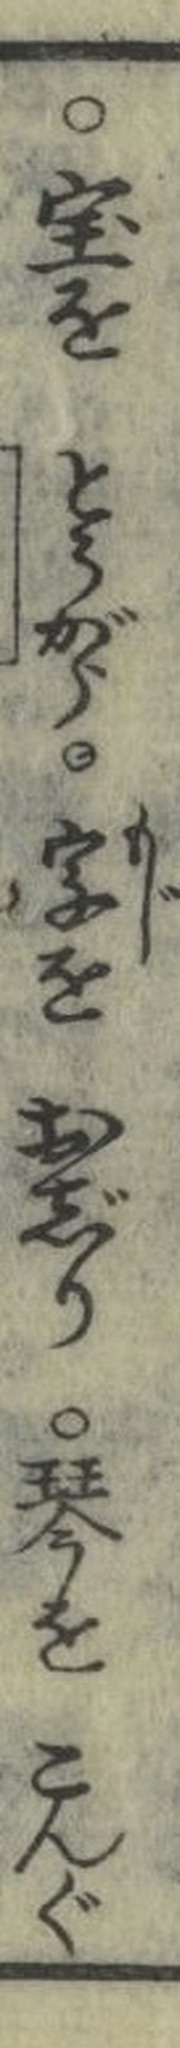○宝をとうがら○字をおじり○琴をこんぐ

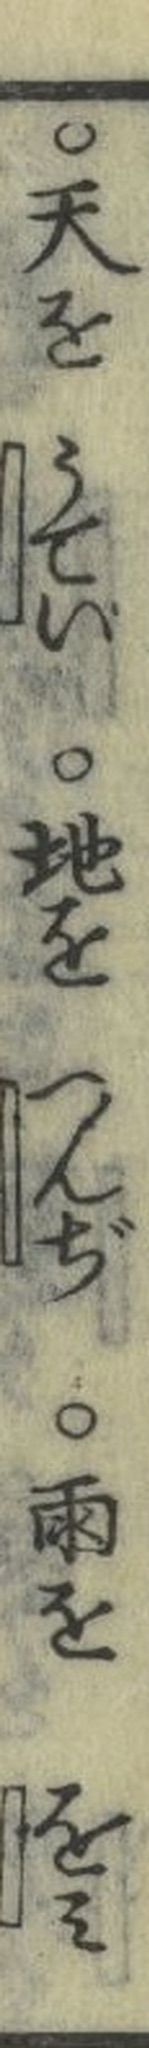○天をうてい○地をつんぢ○雨ををみ
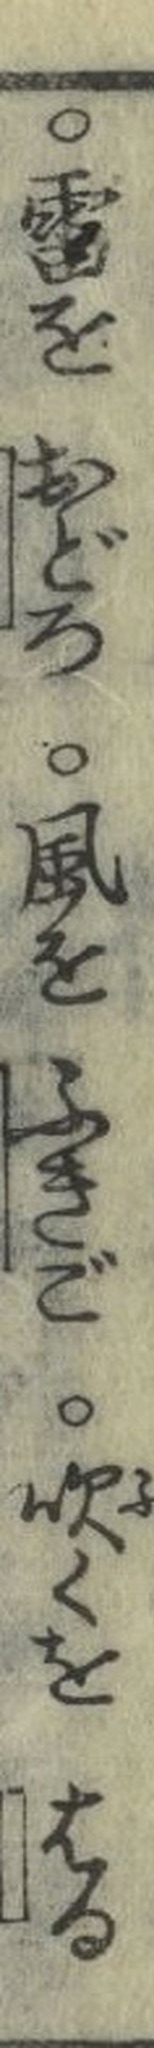○雷をおどろ○風をふきご○吹くをはる
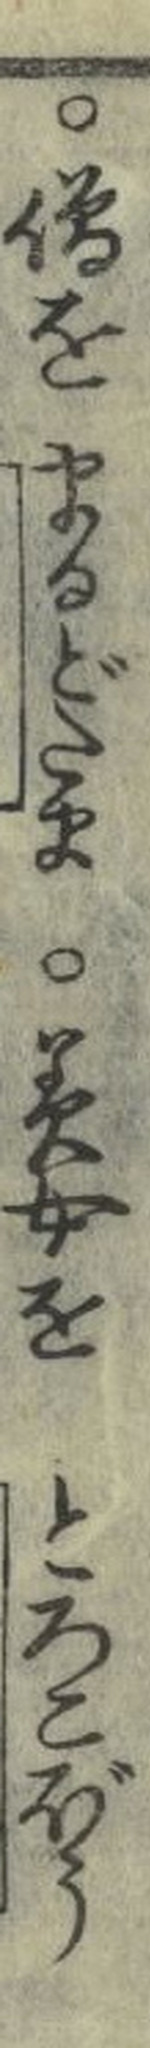○僧をまるどさま○美女をとろこぼう
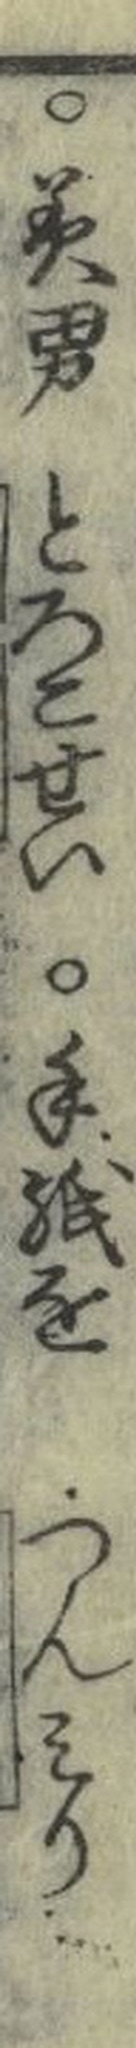○美男をとろこせい○手紙をつんみり
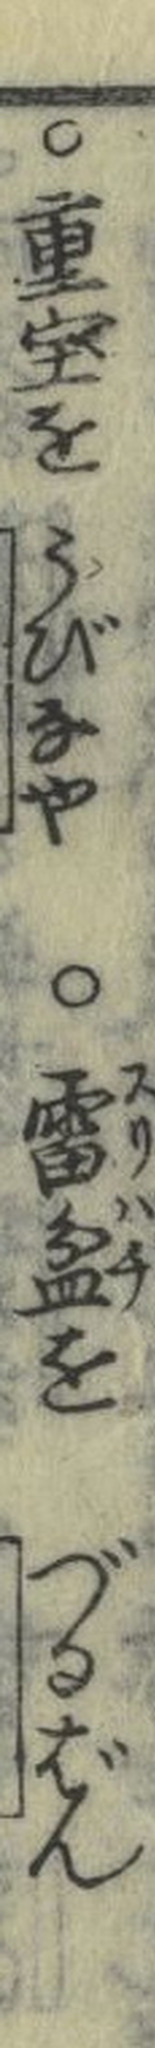○重宝をうびなや○雷盆をづるばん
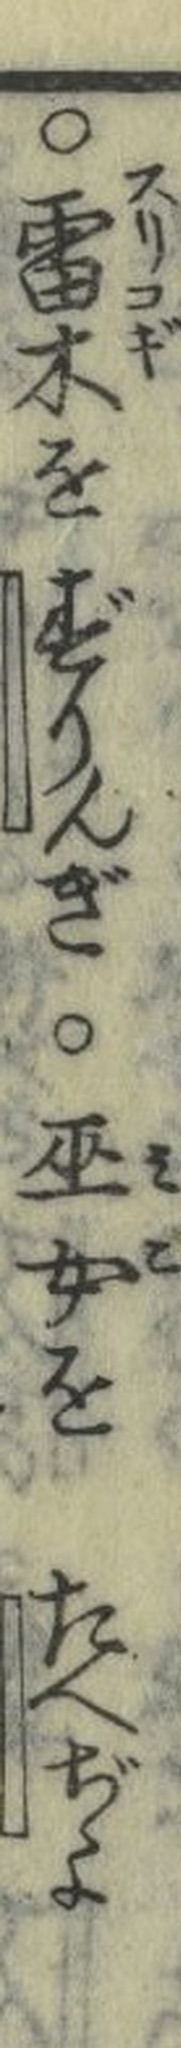○雷木をずりんぎ○巫女をたへぢよ
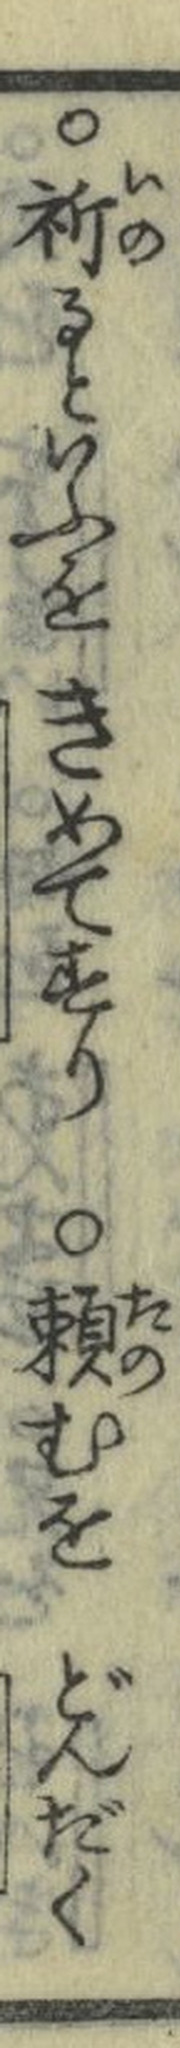○祈るといふをきめてすり○頼むをどんだく
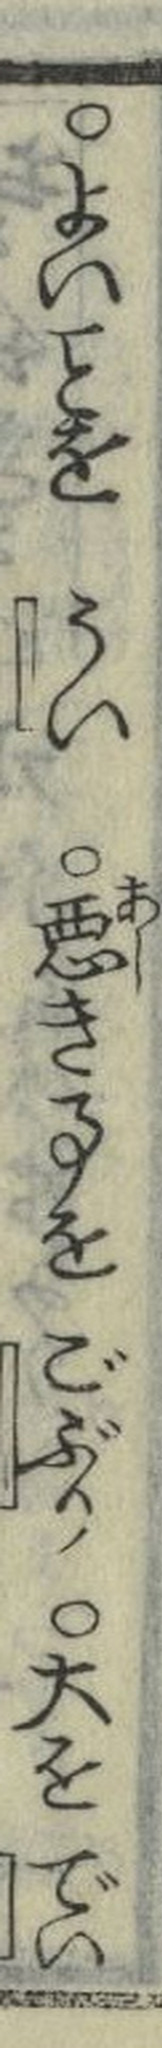○よいことをうい○悪き事をごぶり○大をでい
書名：琉球奇譚
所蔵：University of the Ryukyus Library
